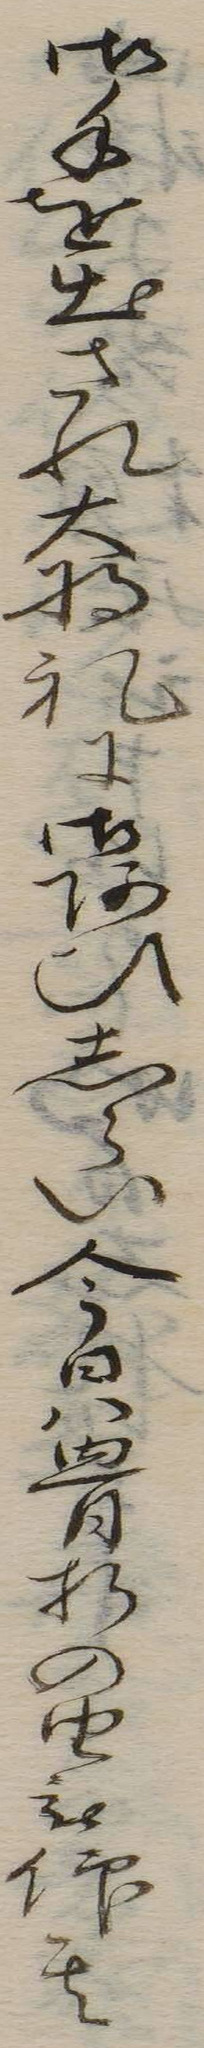御手を出され大将礼に御あひしらい卿は骨折の由被仰其
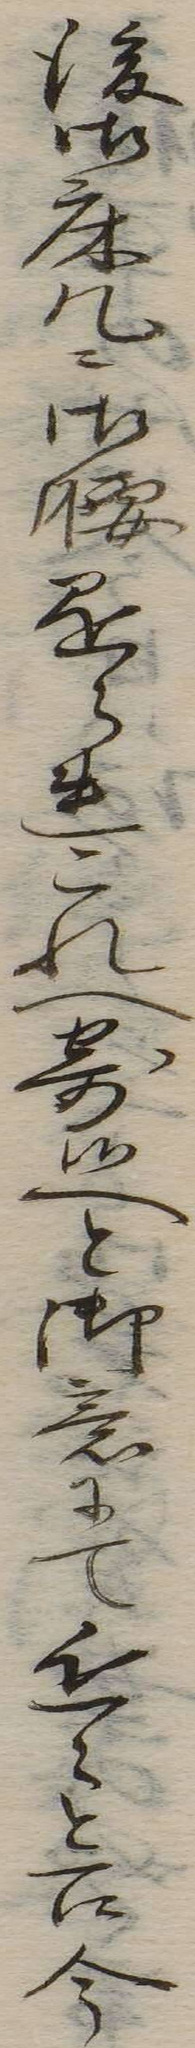後御床几ニ御腰懸られこれへ寄候へと御意にて近々と召今
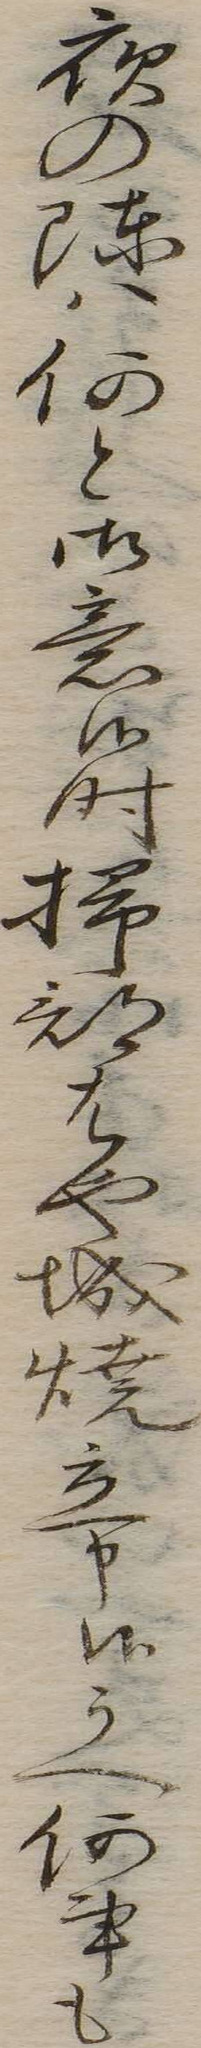夜の陣は何と御意候時掃部はや城焼立申候うへ何事も

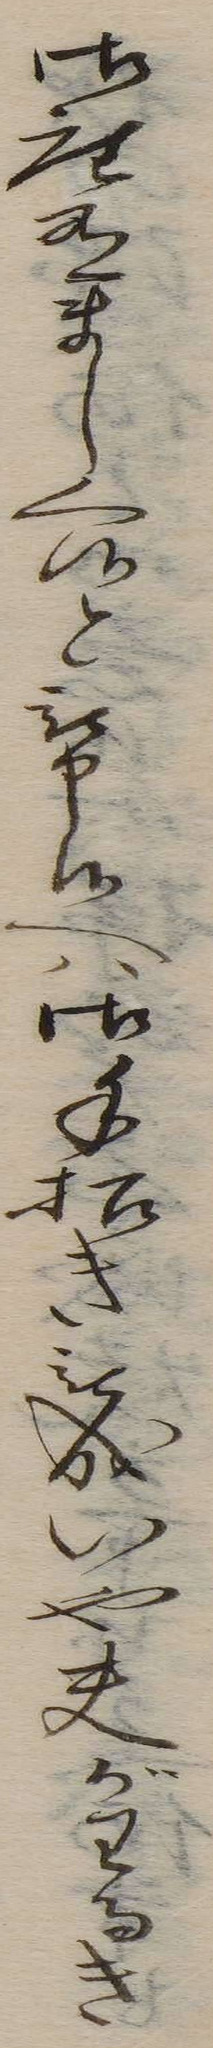御座有ましく候と被申候へは御手招き被成いや夫がわるき
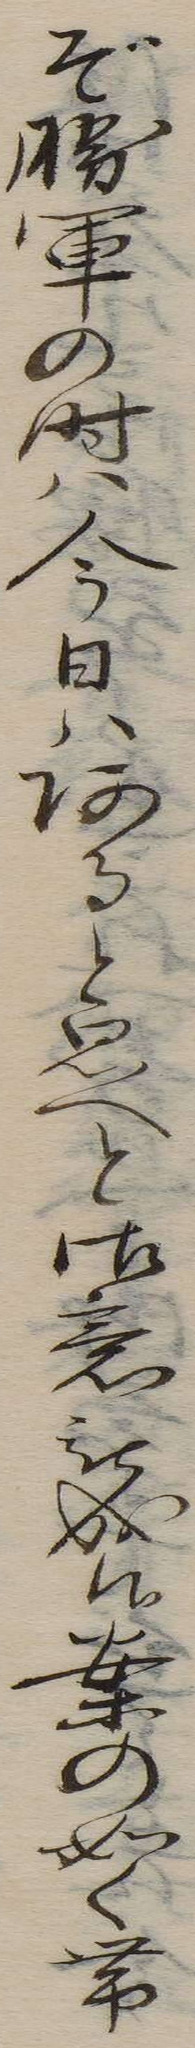ぞ勝軍の時は今日はあると思へと御意被成候案の如く常
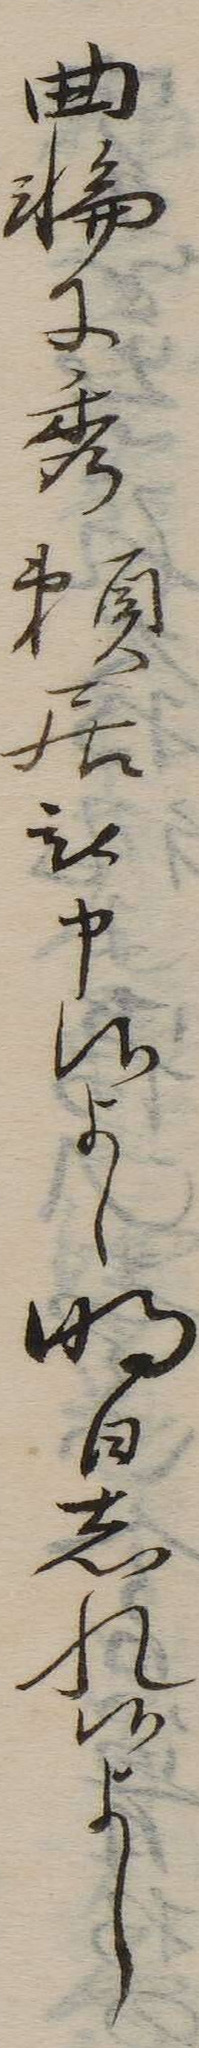曲輪に秀頼居被申候よし明日しれ候よし
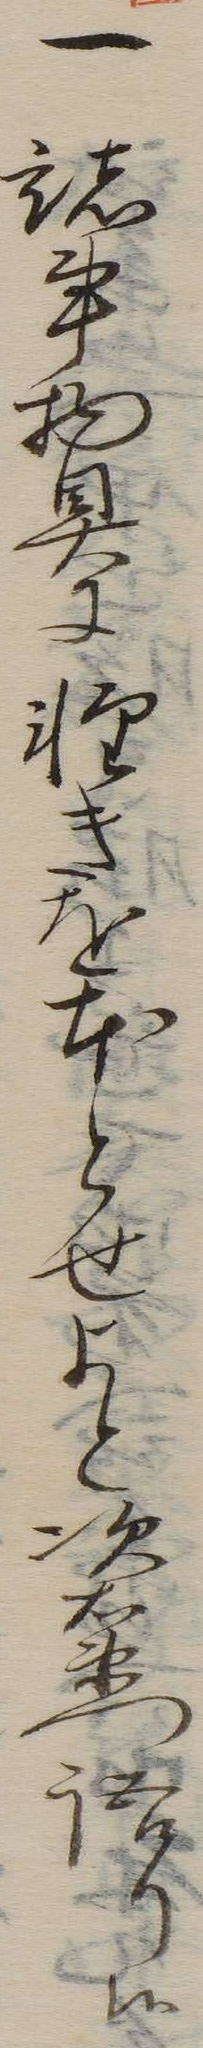一諸事物具に軽きを本とせよと次右衛門語り候
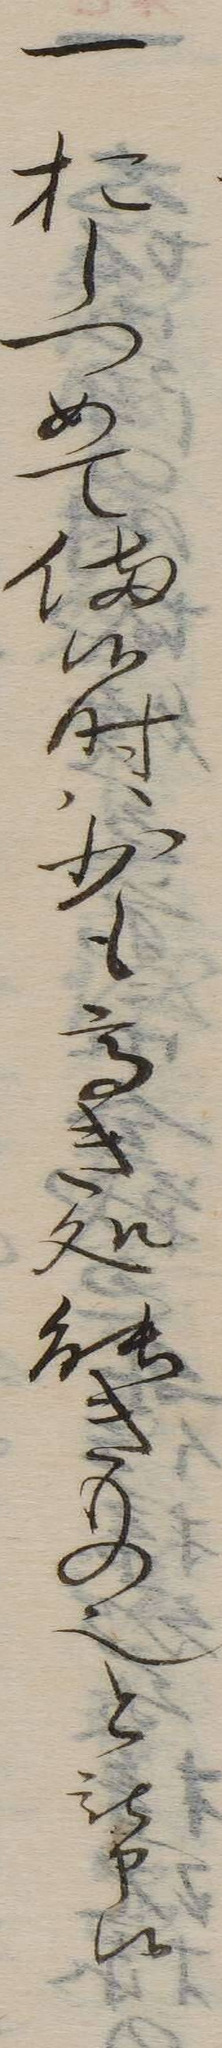一おしつめて備候時は少も高き処能きもの也と被申候
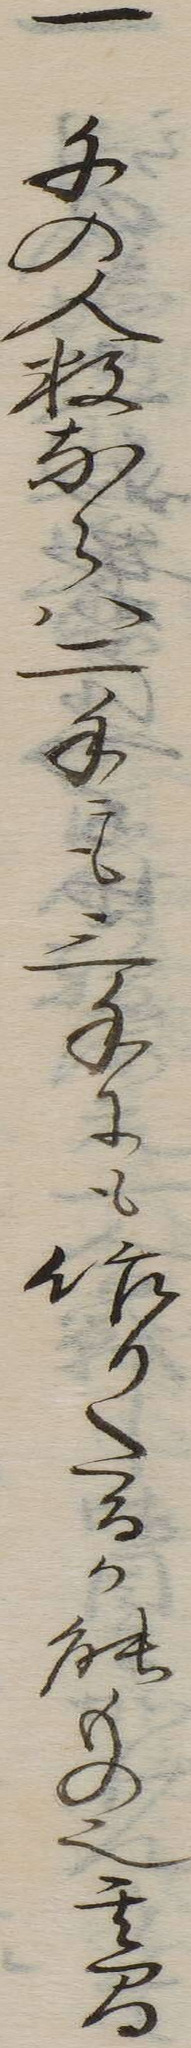一千の人数ならは二手ニも三手にも作りたるか能もの也其間
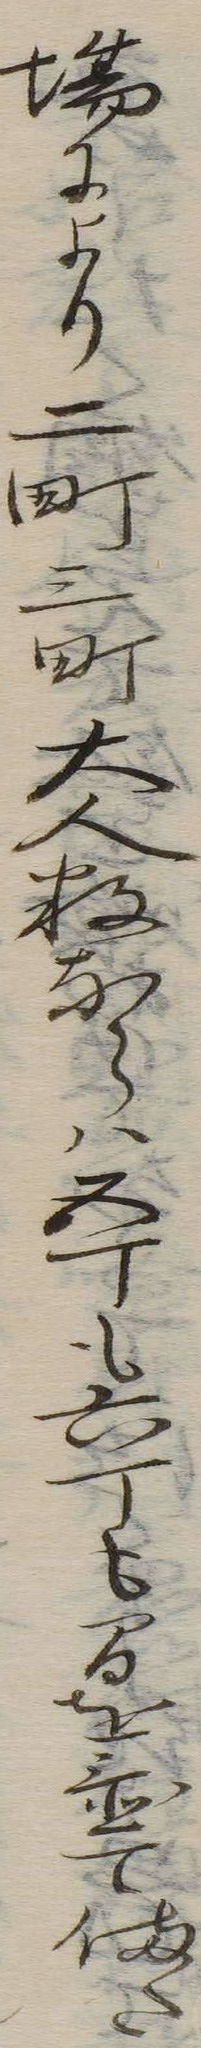場により二町三町大人数ならは五丁も六丁も間を置て備た
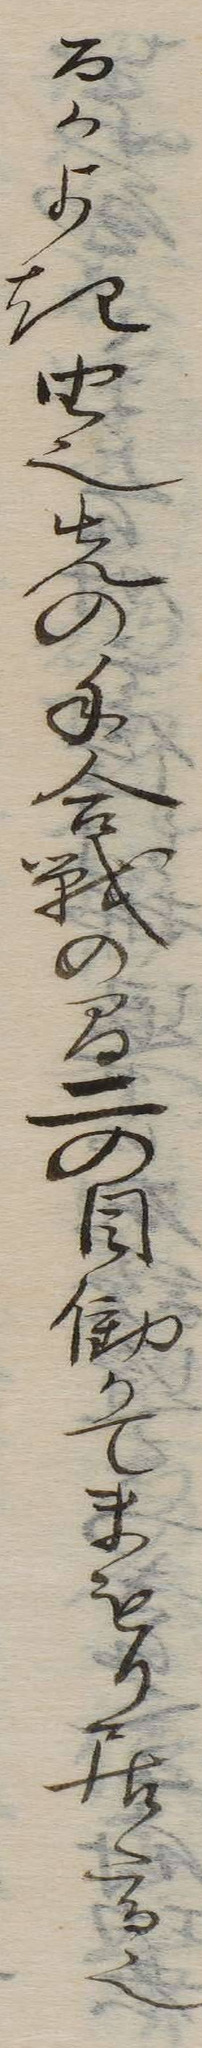るかよき由也先の手合戦の間二の目働かてまもり居たる也
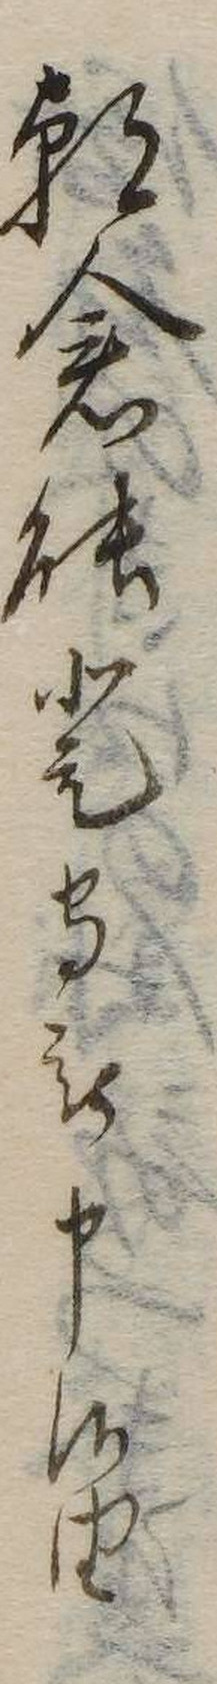朝倉能登守被申候由
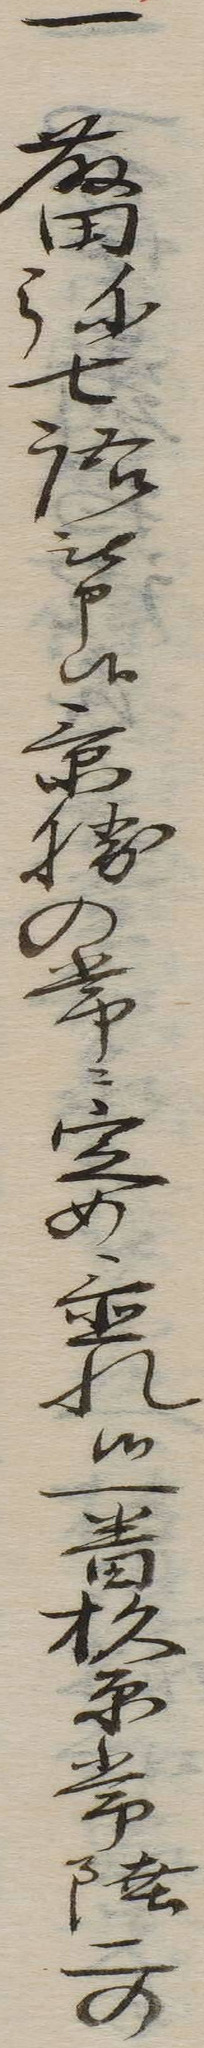一藤田弥七語被申候景勝の常ニ定め置れ候一番杉原常陸ニの
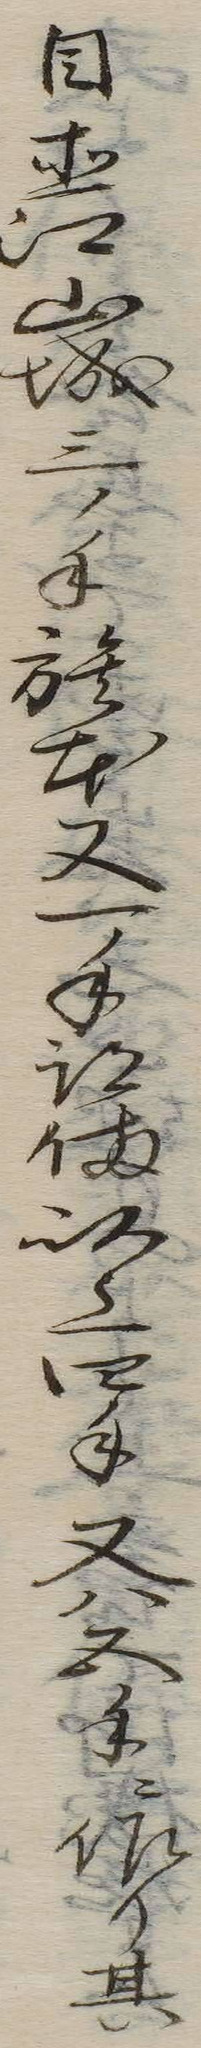目直江山城三ノ手旗本又一手跡備以上四手又は五手ニ作り其
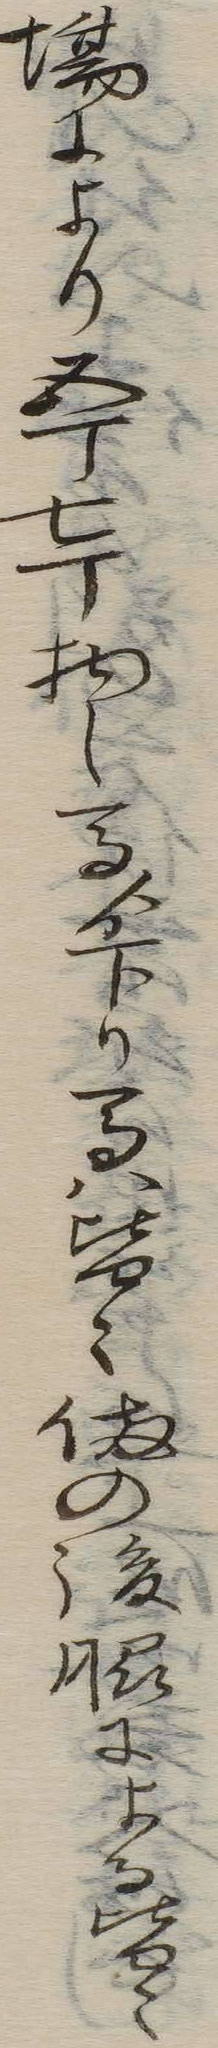場により五丁七丁物し馬ゟ下り馬は皆々備の後脇による皆々
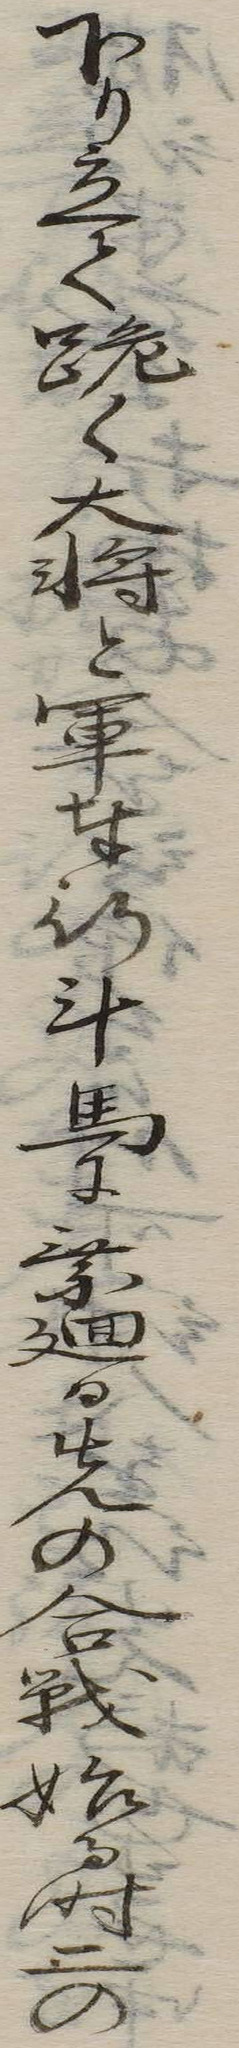下り立て跪く大将と軍奉行斗馬に乗廻る先の合戦始る時ニの
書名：三河之物語
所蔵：国文学研究資料館
